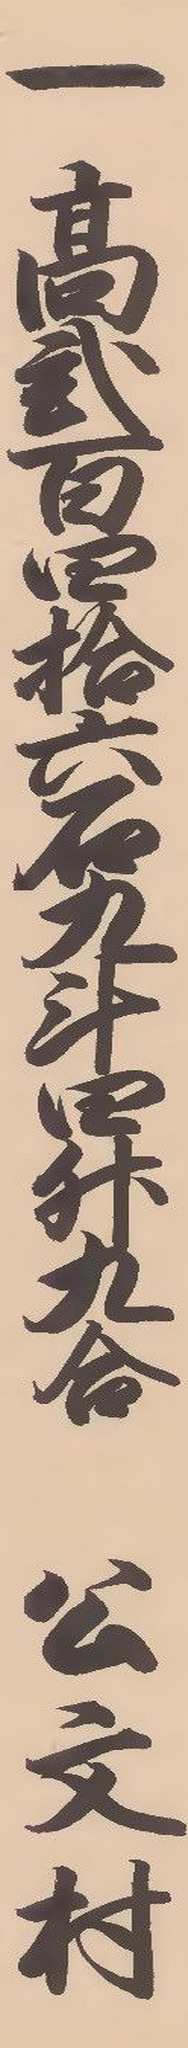一高弐百四拾六石九斗四升九合公文村
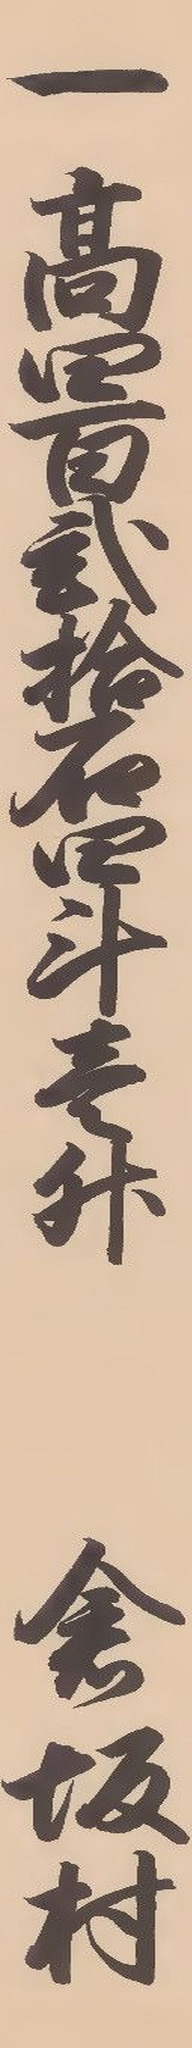一高四百弐拾石四斗壱升倉坂村
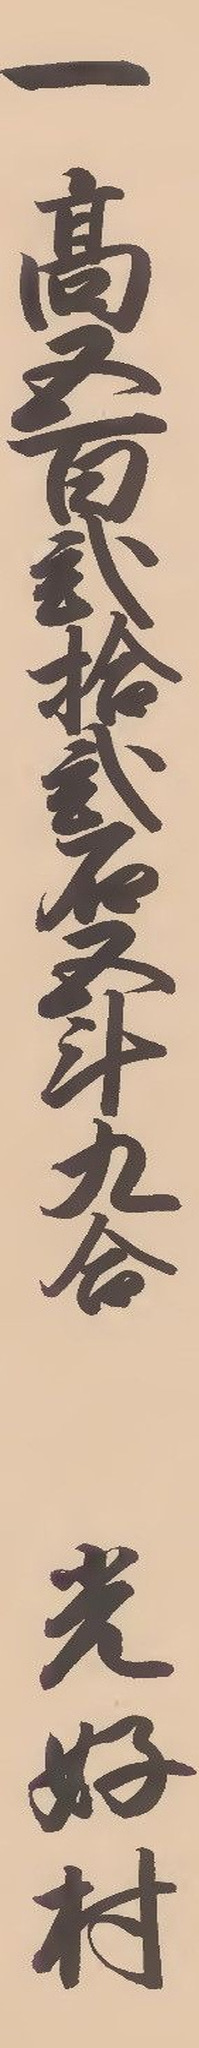一高五百弐拾弐石五斗九合光好村

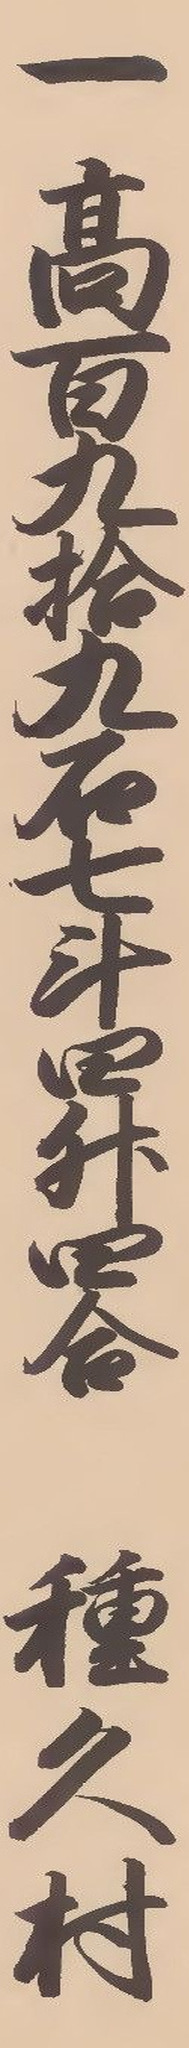一高百九拾九石七斗四升四合種久村
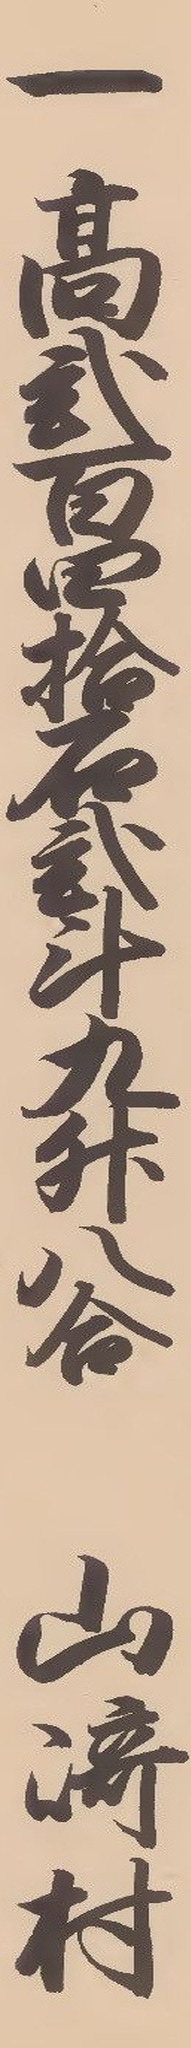一高弐百四拾石弐斗九升八合山崎村
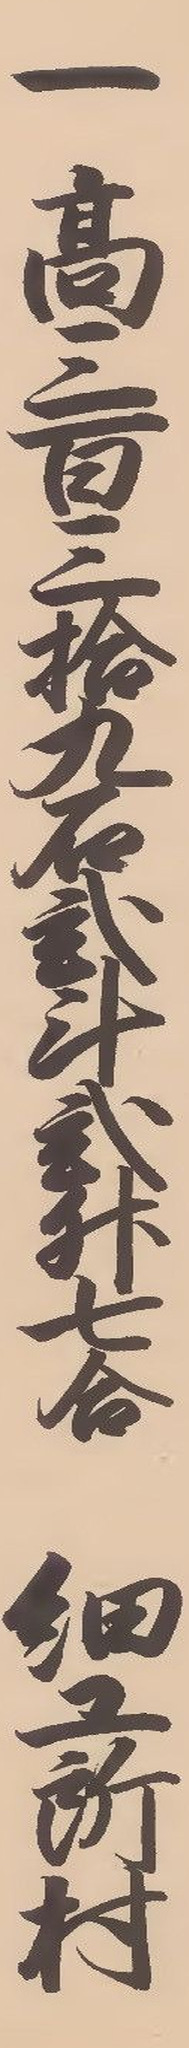一高三百三拾九石弐斗弐升七合細工所村
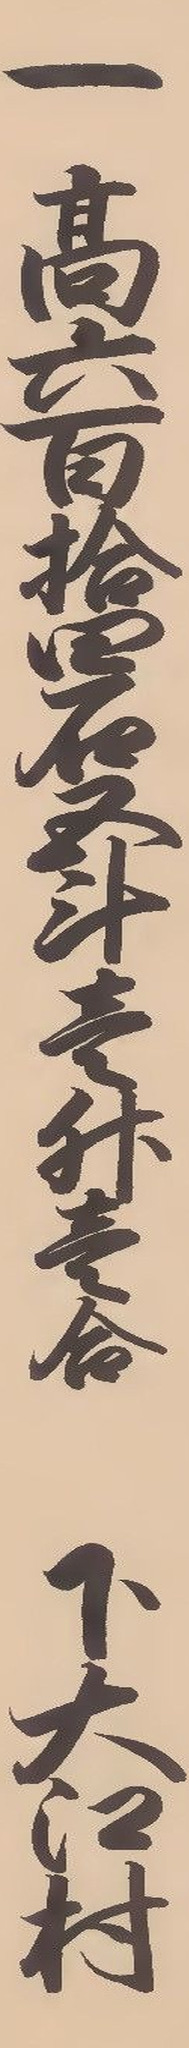一高六百拾四石五斗壱升壱合下大江村
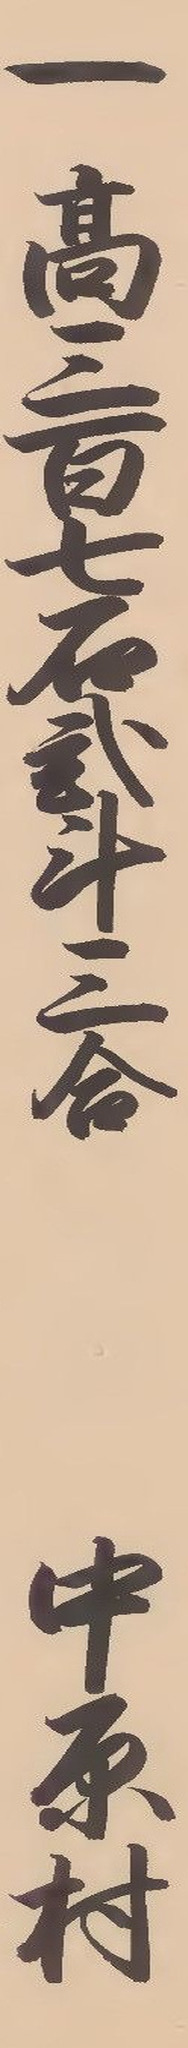一高三百七石弐斗三合中原村
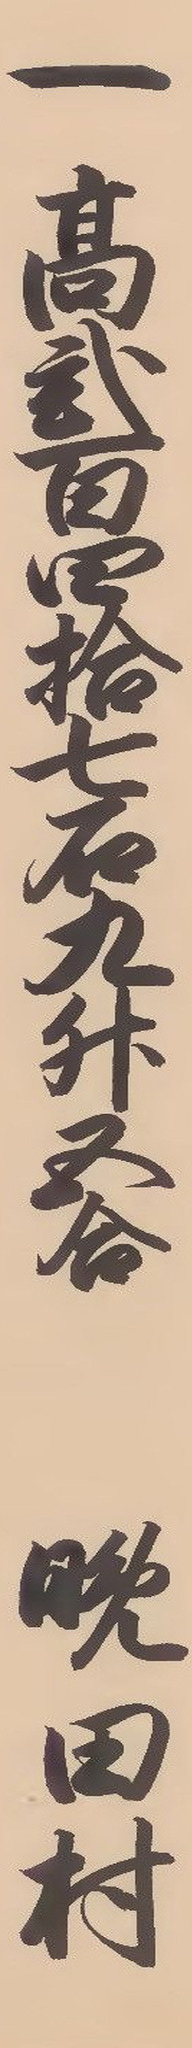一高弐百四拾七石九升五合晩田村
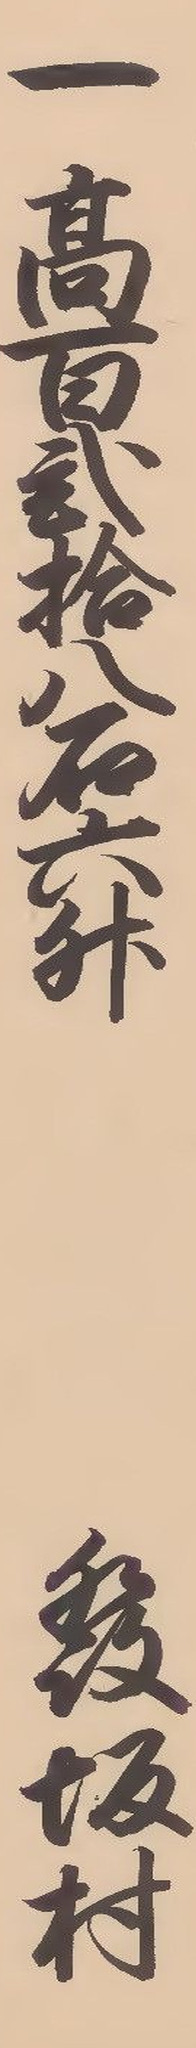一高百弐拾八石六升発坂村

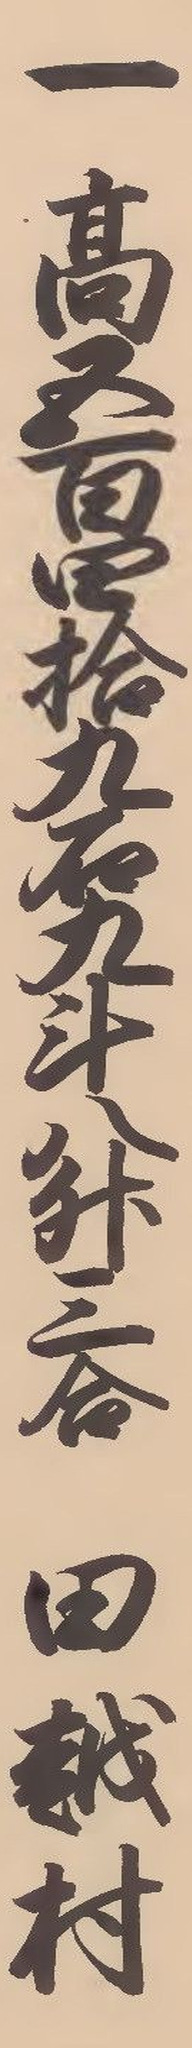一高五百四拾九石九斗八升三合田越村
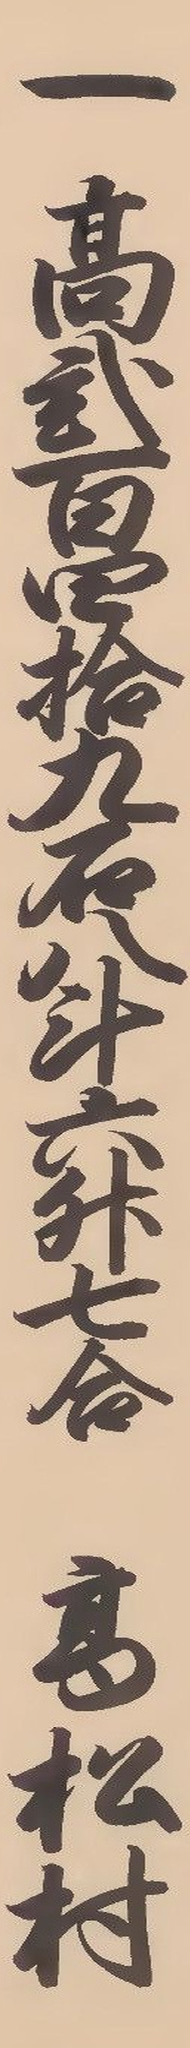一高弐百四拾九石八斗六升七合高松村
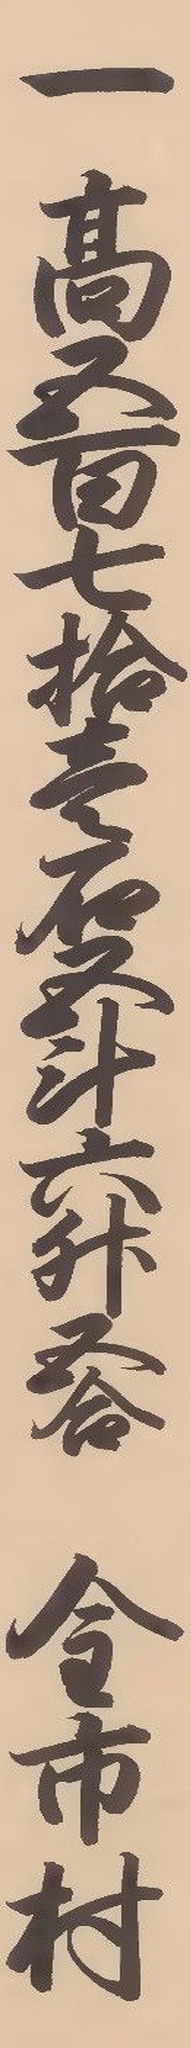一高五百七拾壱石五斗六升五合金市村
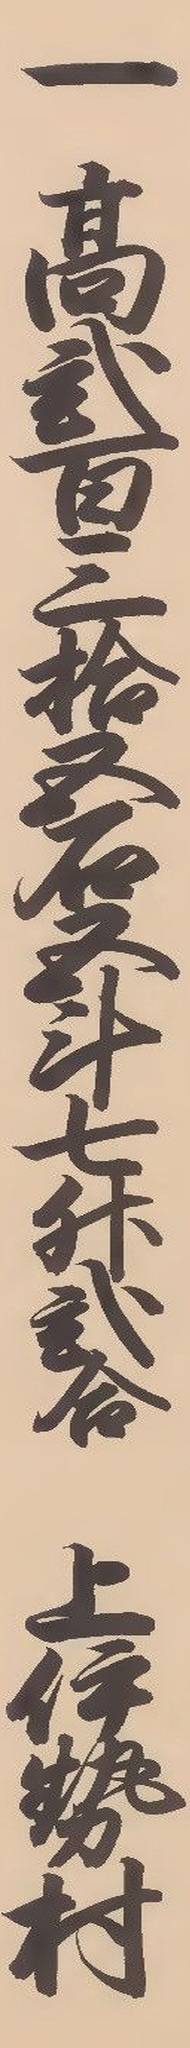一高弐百三拾五石五斗七升弐合上伊勢村
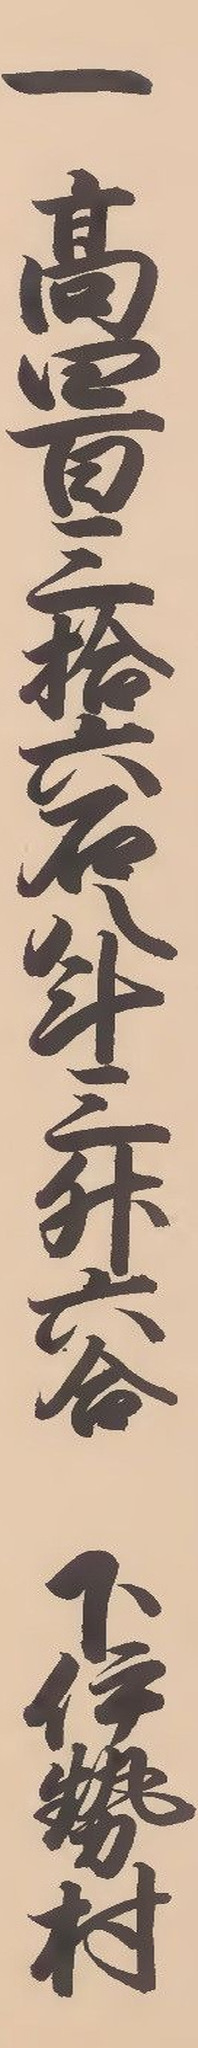一高四百三拾六石八斗三升六合下伊勢村
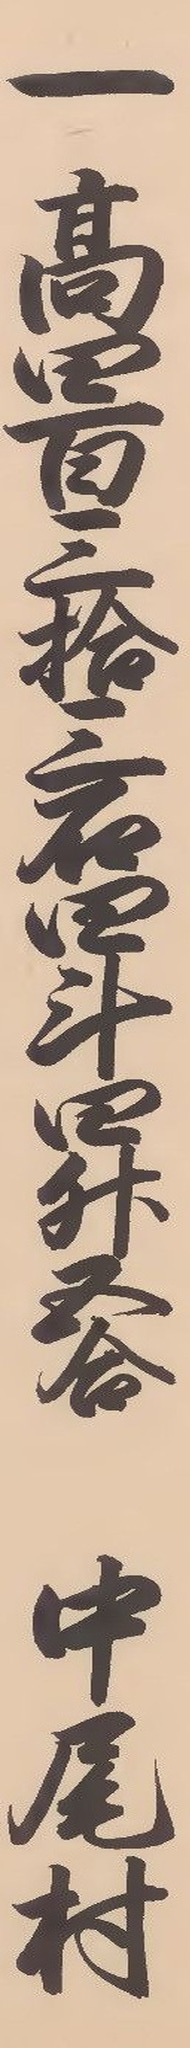一高四百三拾三石四斗四升五合中尾村
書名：伯耆国郷帳
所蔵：国立公文書館 National Archives of Japan
